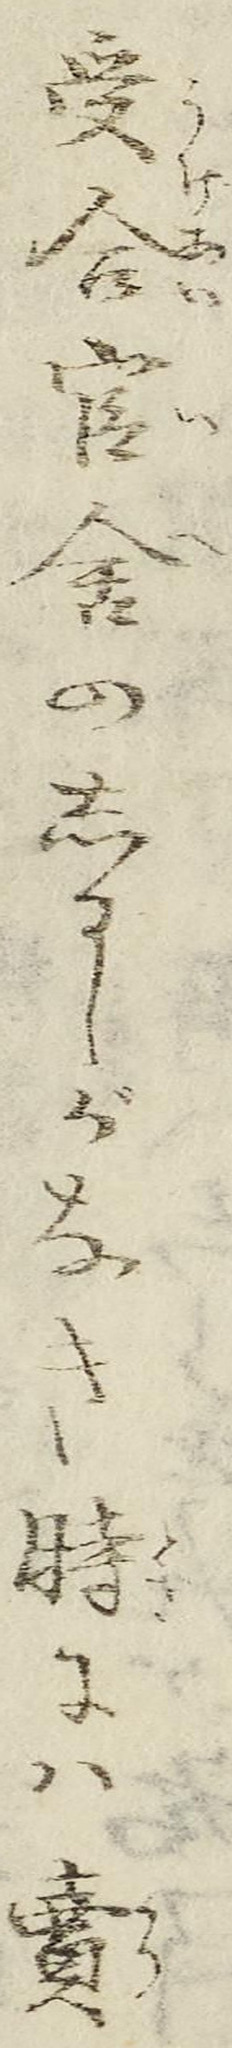受合官舎のしるしがなき時には売
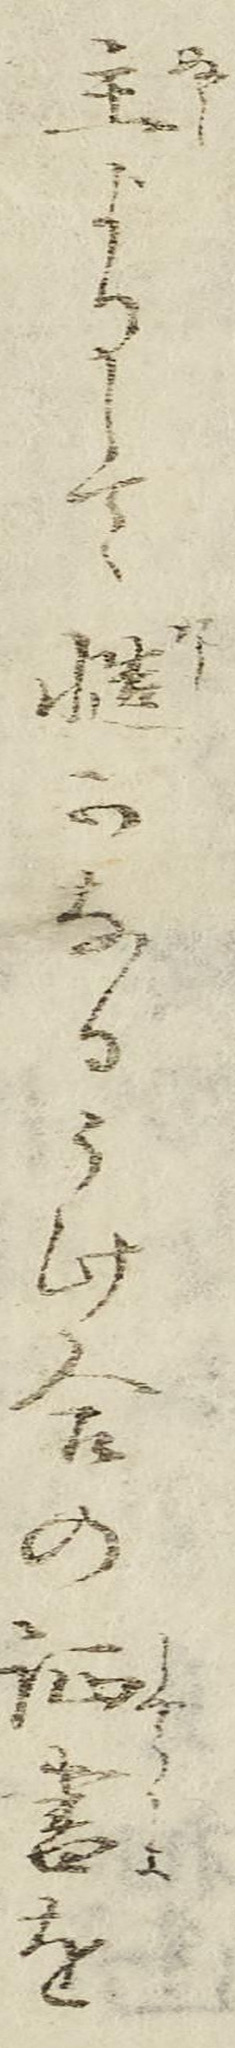主よりして慥かなるうけ合の証書を
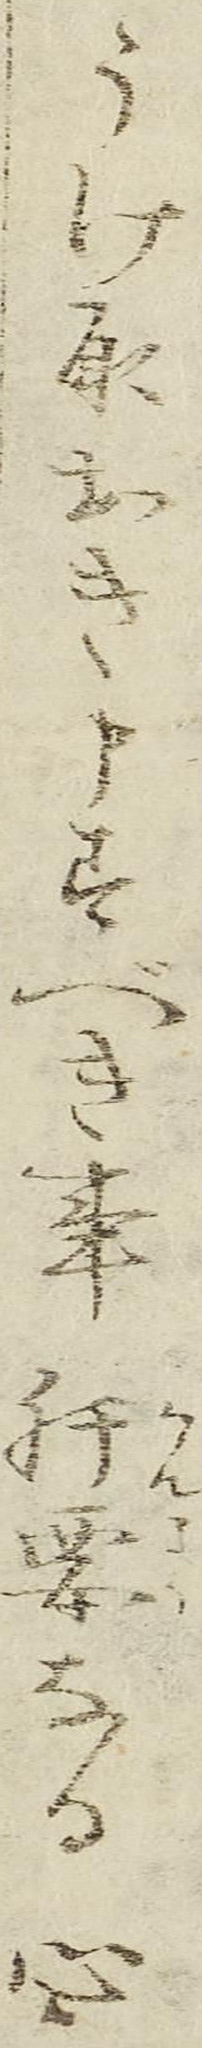うけ取おき申すべき事肝要なる心

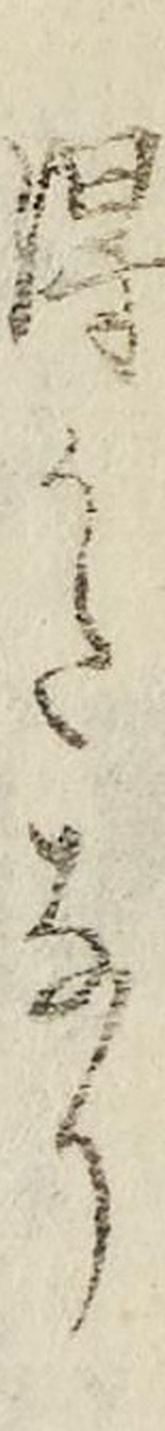得かたなり
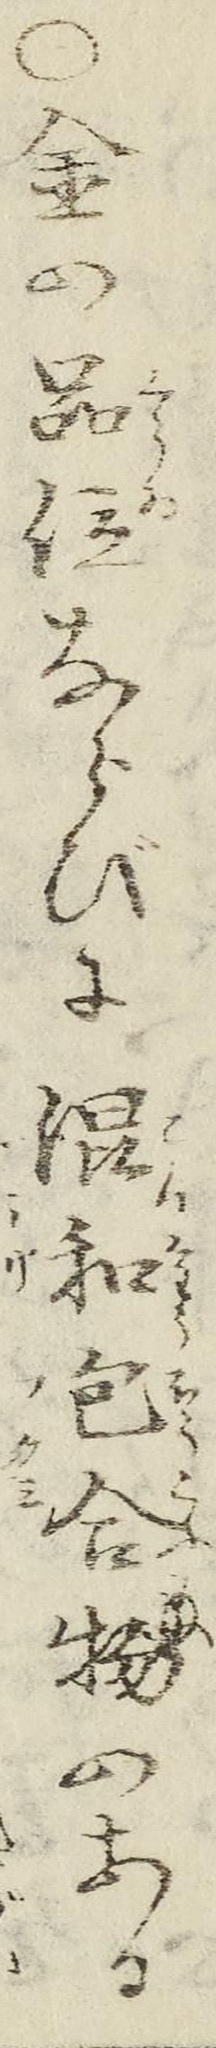○金の品位ならびに混和包合物のある
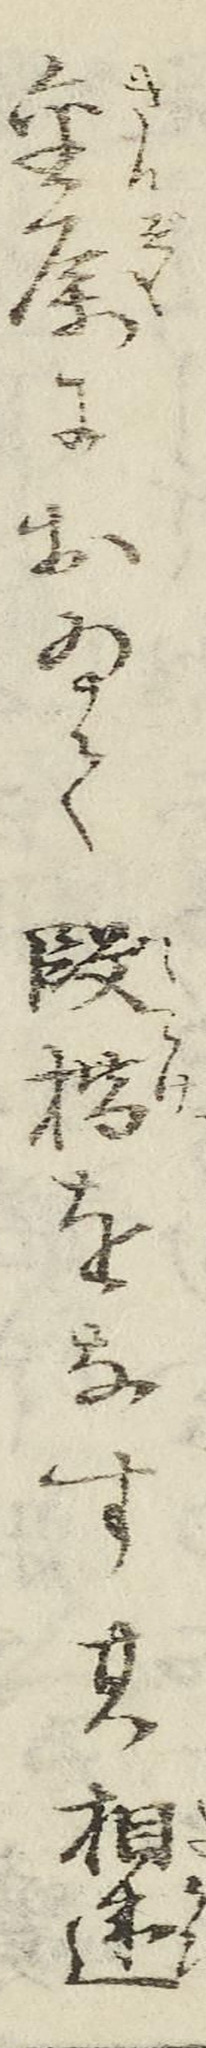金属におゐて叚楷をなす其相違
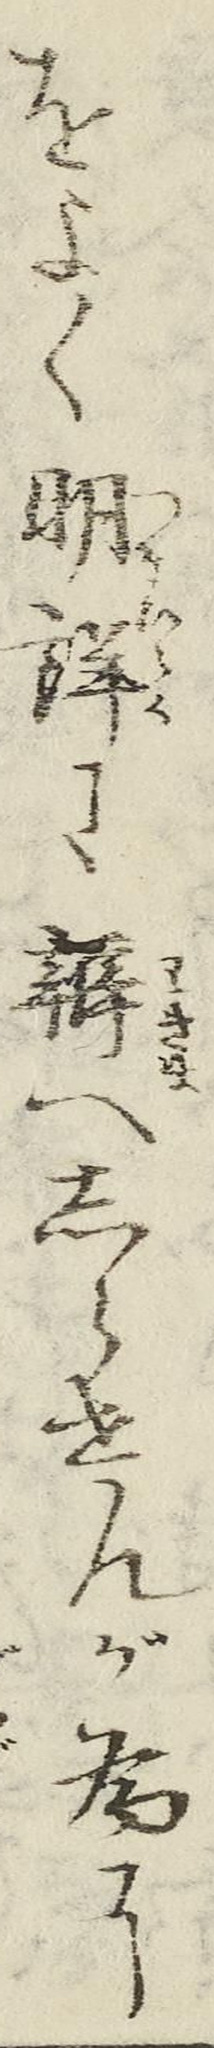をよく明詳に弁へしらせんが為に
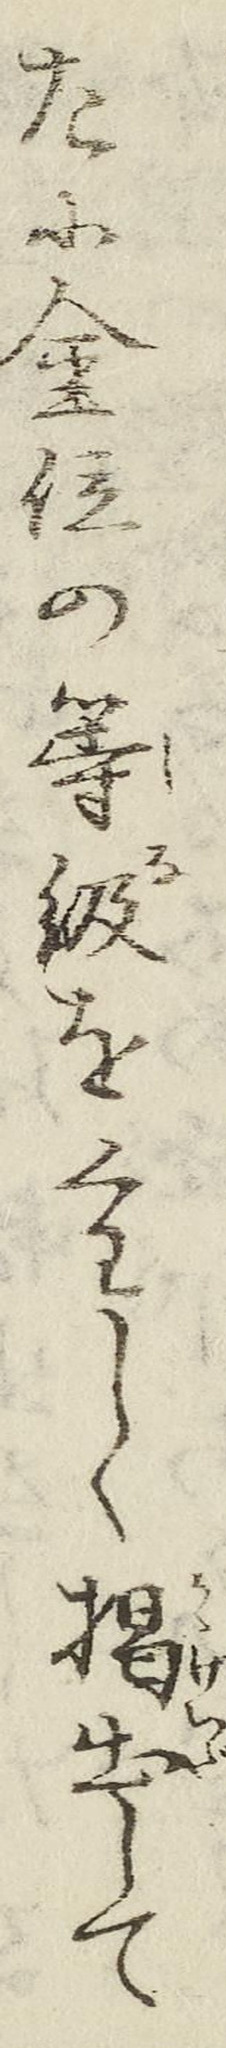左に金位の等級をくわしく掲出して
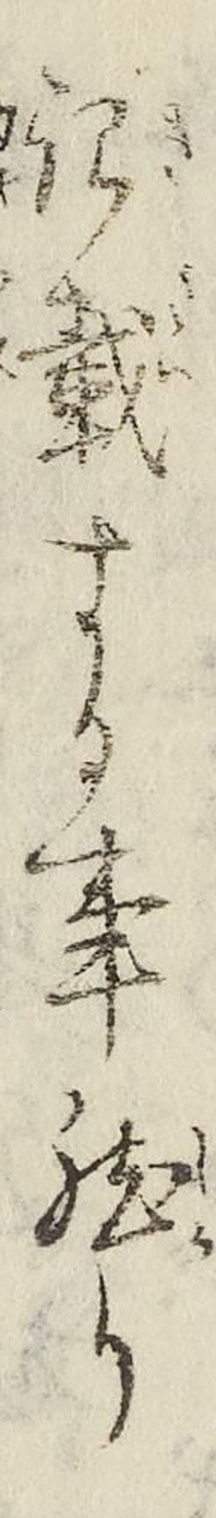記載する事然り
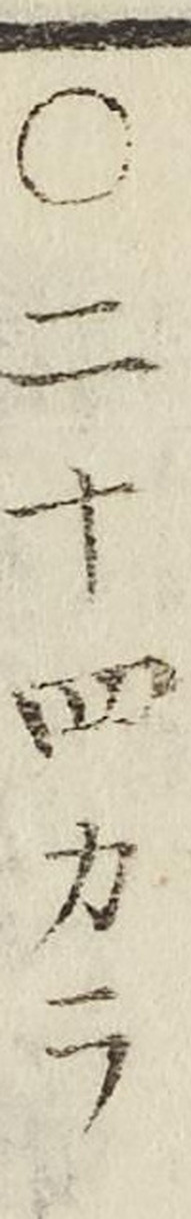○二十四カラ
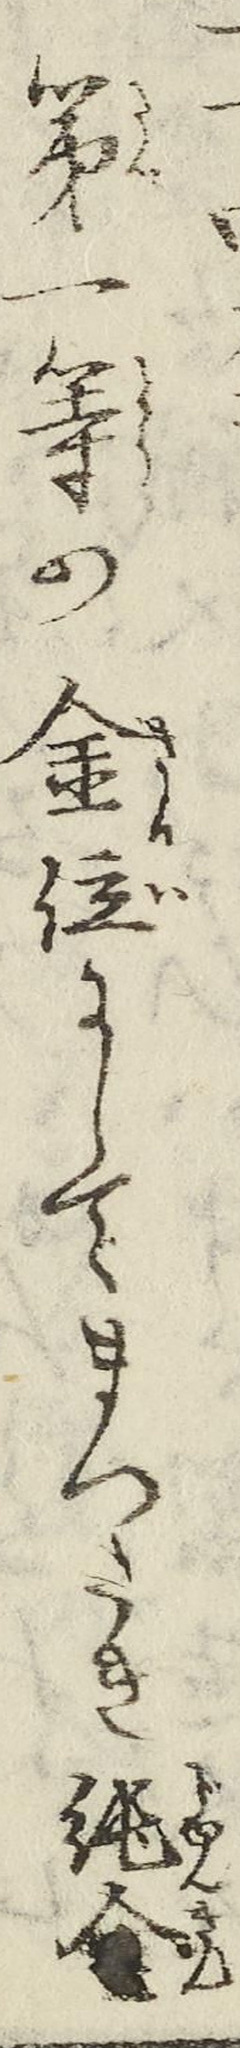第一等の金位にしてまつたき純金
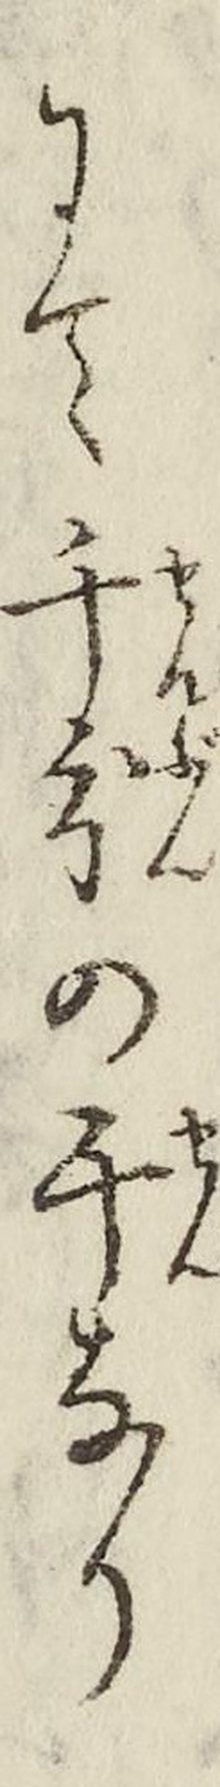にて千分の千なり
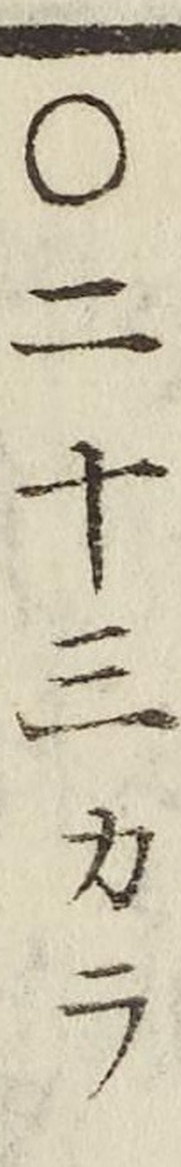○二十三カラ
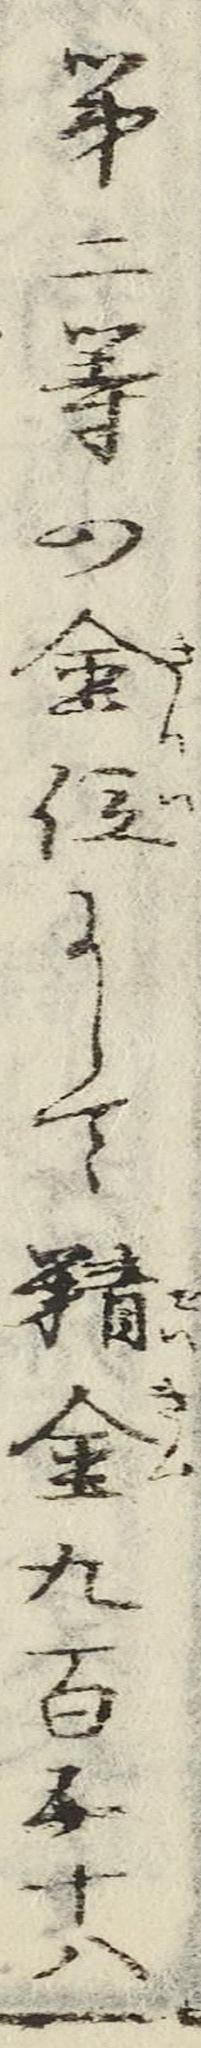第二等の金位にして精金九百五十八
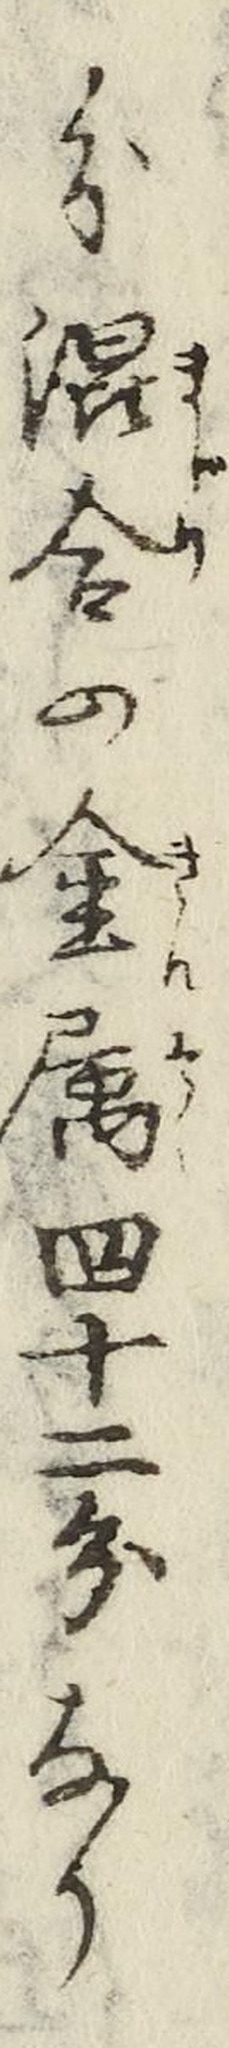分混合の金属四十二分なり
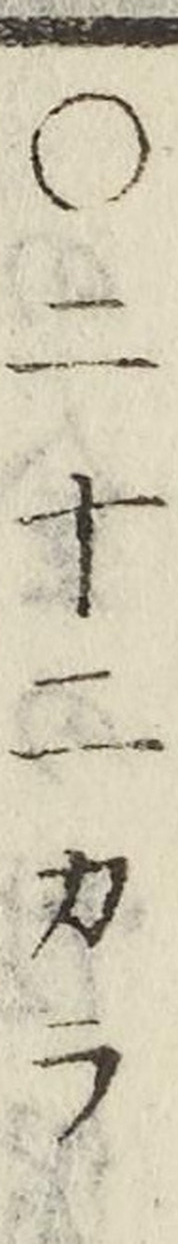○二十二カラ
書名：[時計に関する冊子]
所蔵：東京大学地震研究所図書室 Earthquake Research Institute Library, The University of Tokyo, JAPAN
